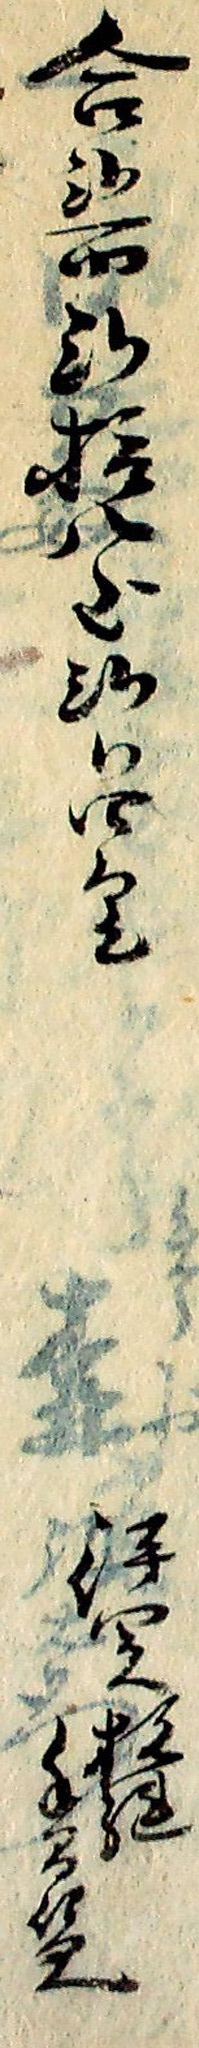合弐百弐拾八匁弐分四厘待関杭継
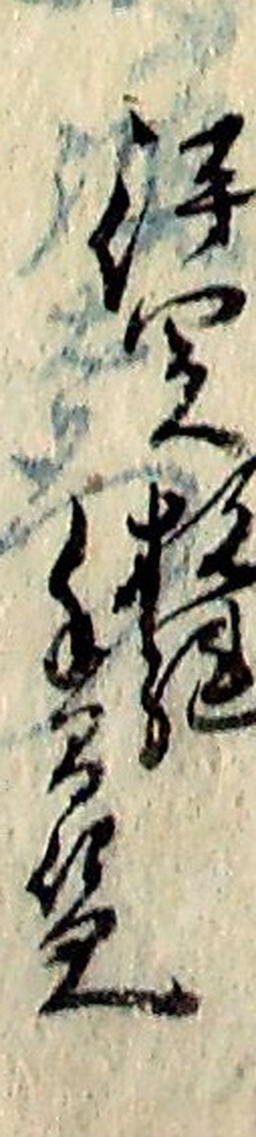手間賃
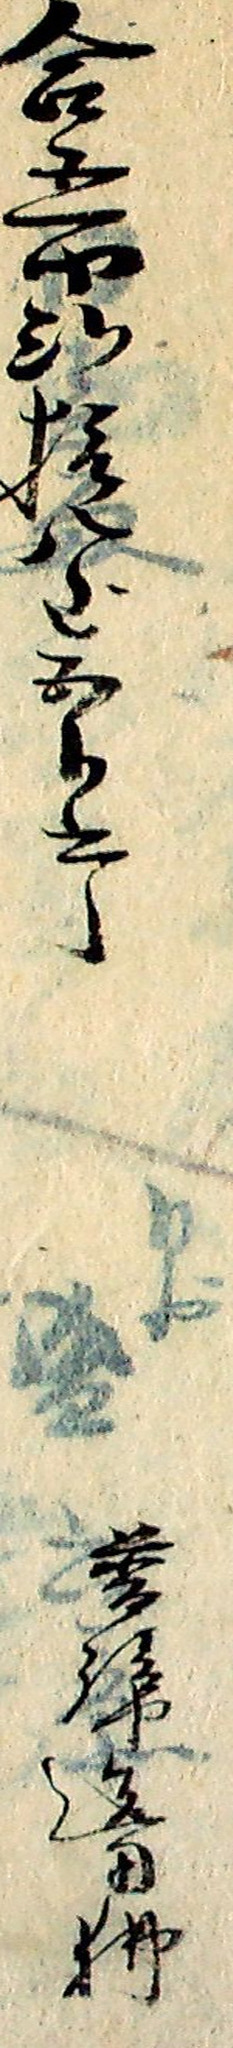合五百弐拾八匁五分六厘普請中造用払
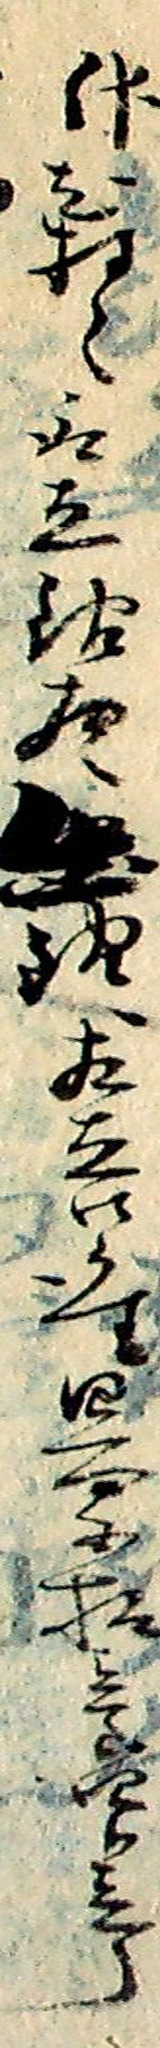代尤村々取立銀押へ出銀へ相立御座候日百五拾壱匁四分壱厘
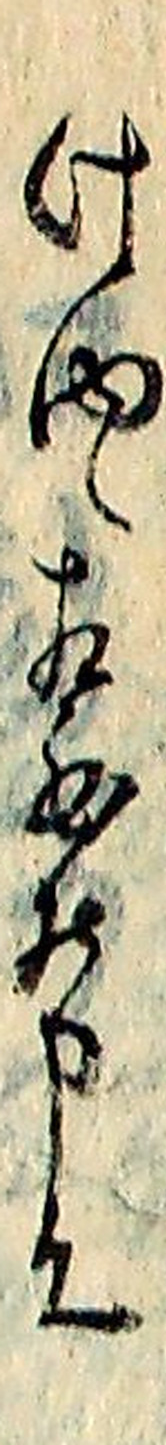此内へ相出被申候

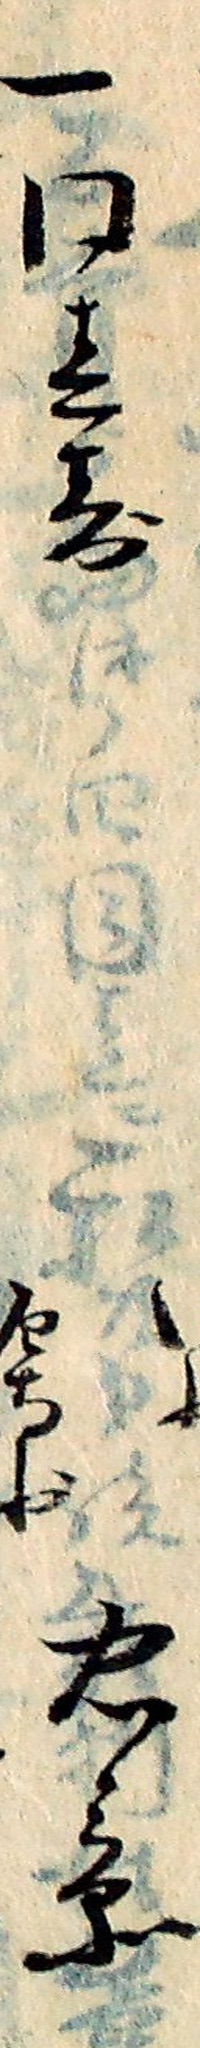一同壱歩同村忠兵衛
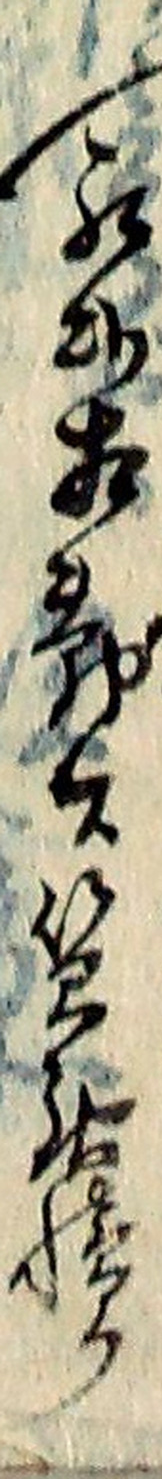罷出相勤候賃銀積り
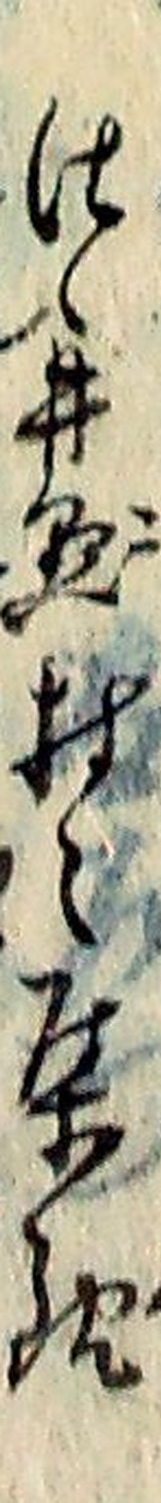仕候井懸村々集銀
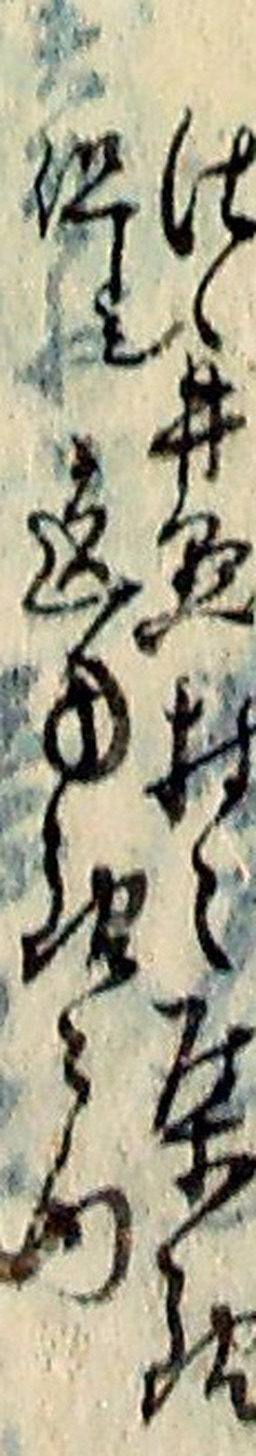但し造用銀之内
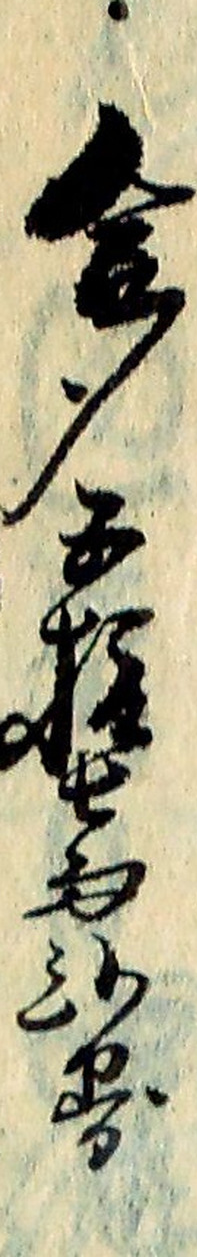金〆五拾七両弐歩
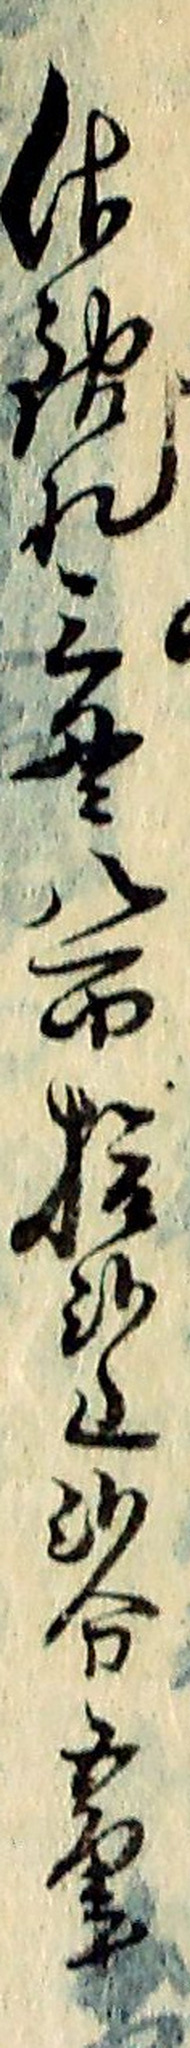代銀札三貫八百拾弐匁弐分五厘
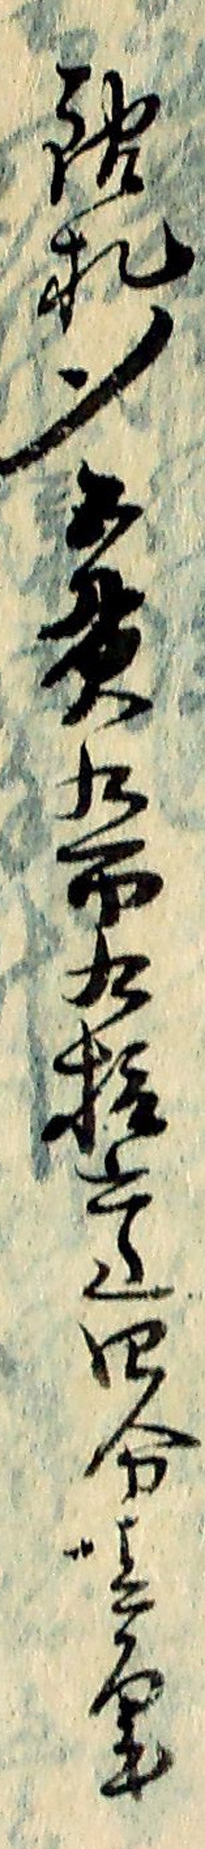銀札〆五貫九百九拾六匁四分壱厘
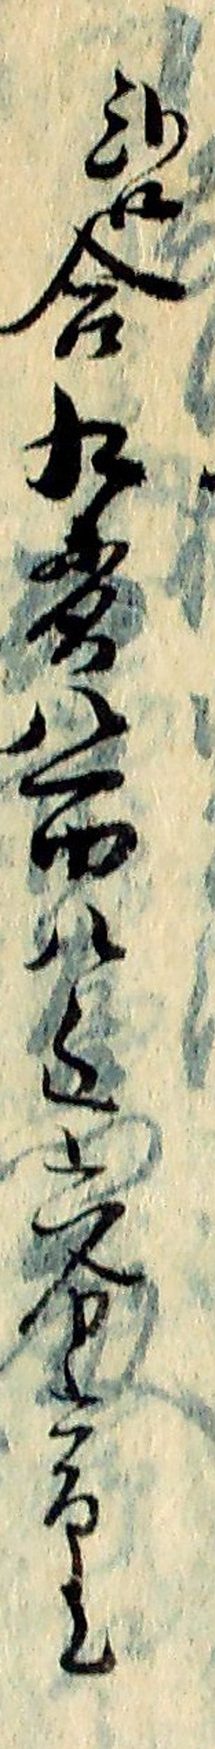弐口合九貫八百八匁六分六厘
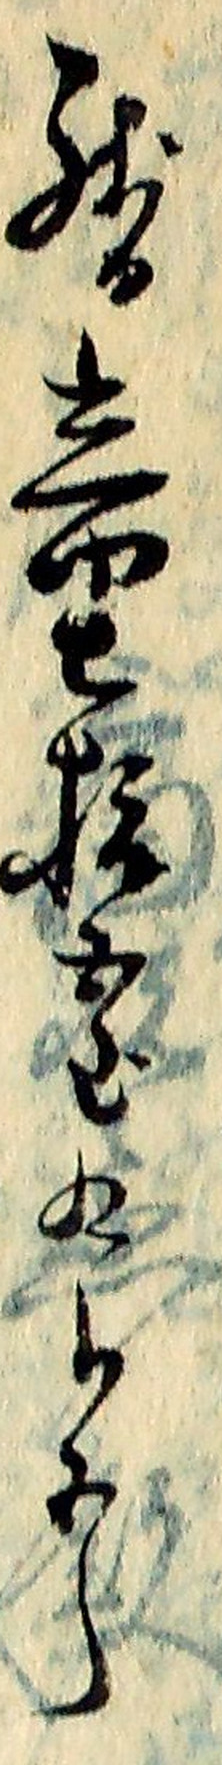残而六百七拾五匁九分五厘不足
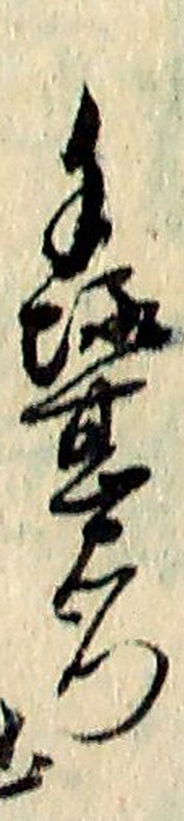手塚甚右衛門
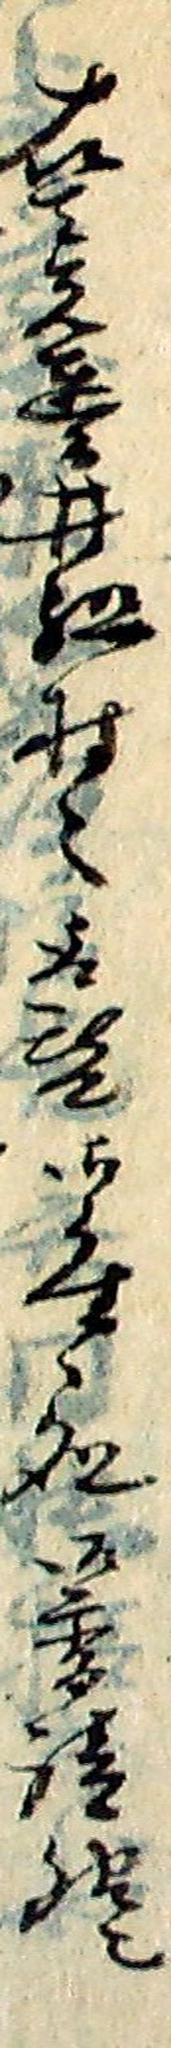右は先達て井組村々取替御座候処御普請銀に
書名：諸御願書控(後藤氏壱番）
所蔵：鳴門教育大学 Naruto University of Education
